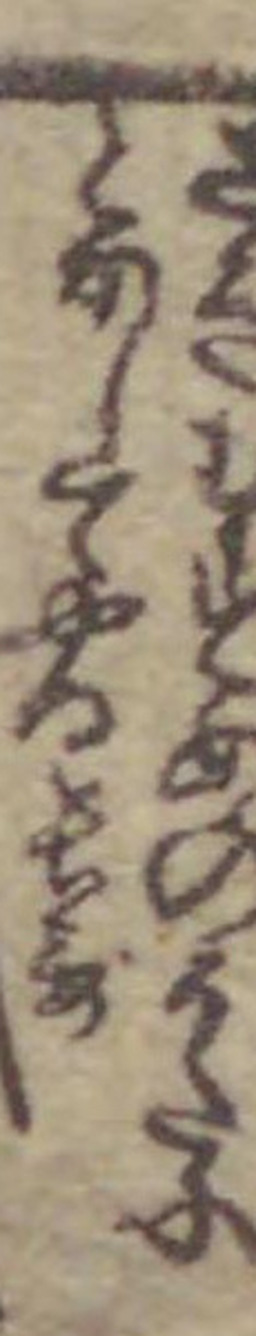とかしてやる長哥
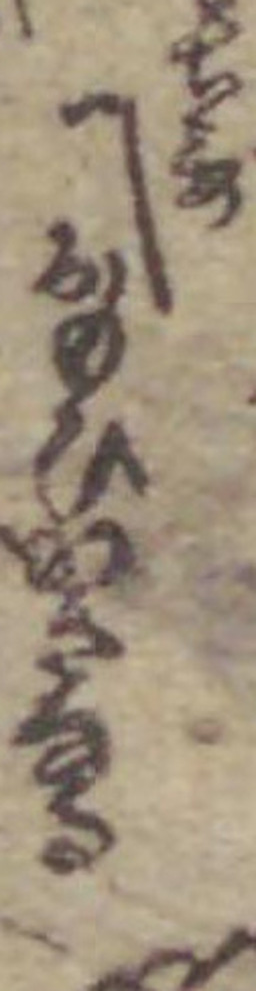「おもひかさなる
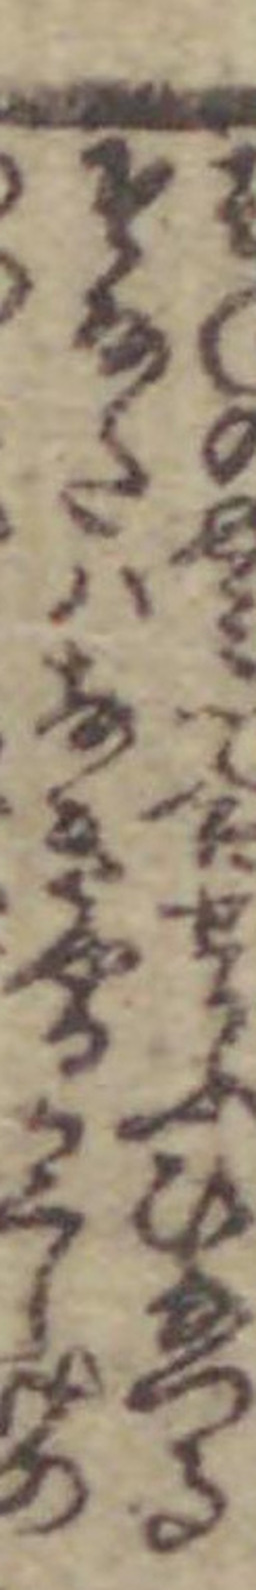そなたハなきやるかくしけの
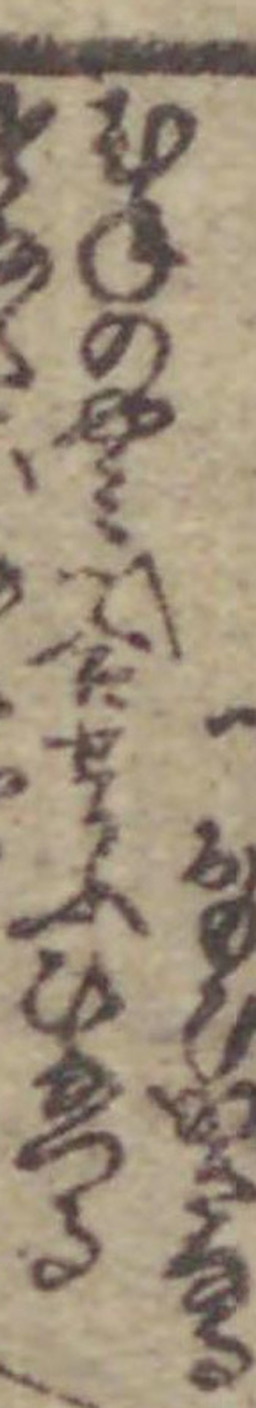むねのやミ「合せりふひなつる
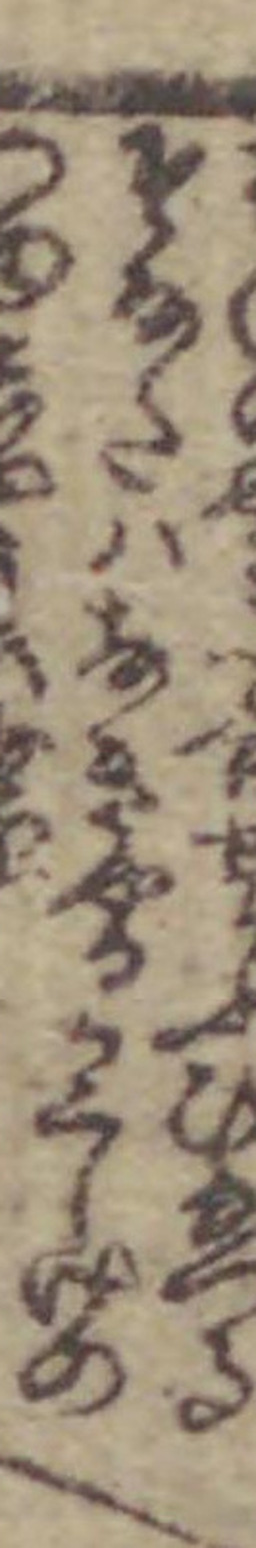そなたハなきやるかくしけの
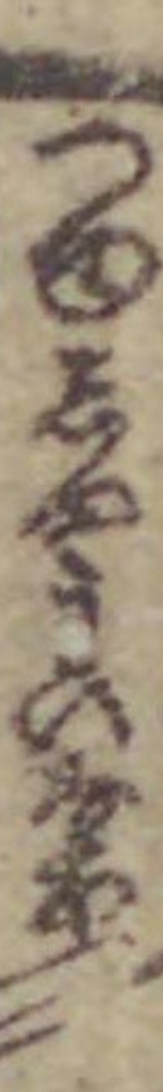つゆしやわいなあ
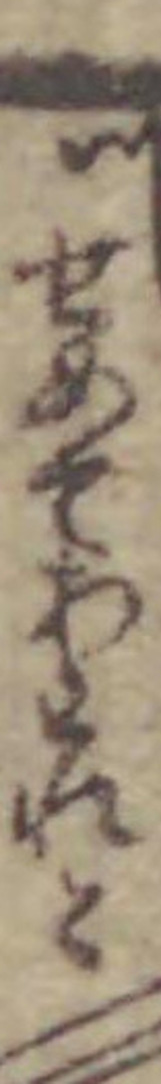「せめてあわれと
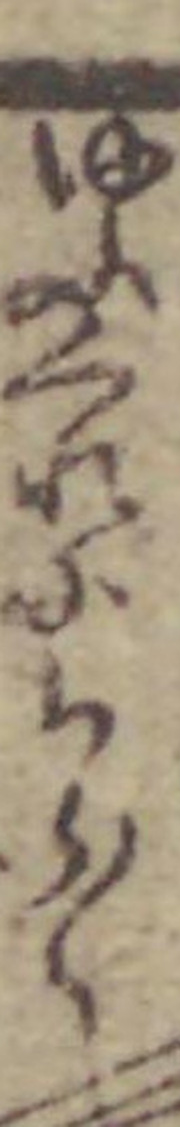ゆふくれにちら〳〵
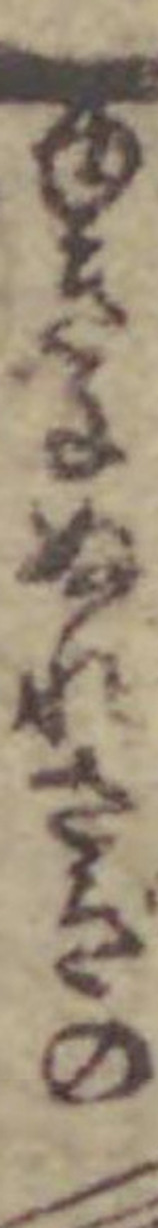ゆきにぬれさぎの
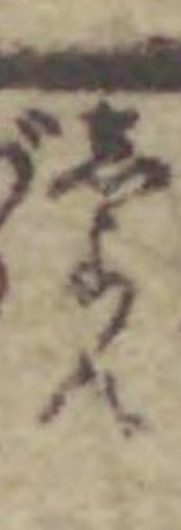しよん
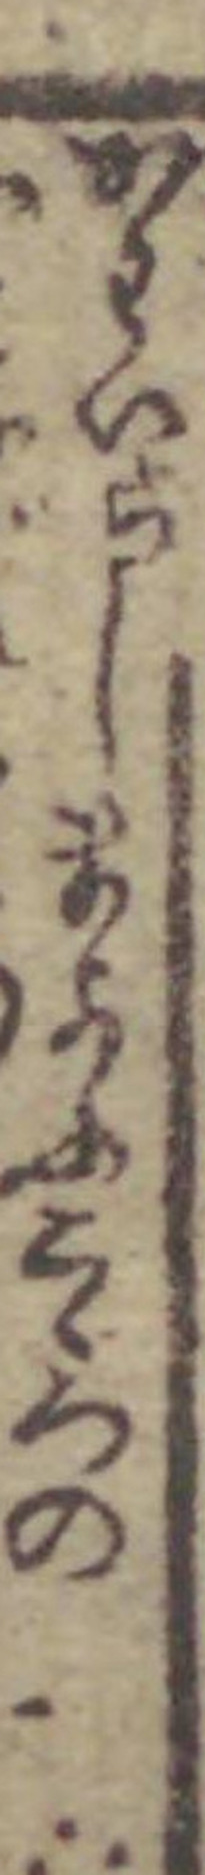かわいらしまよふこゝろの
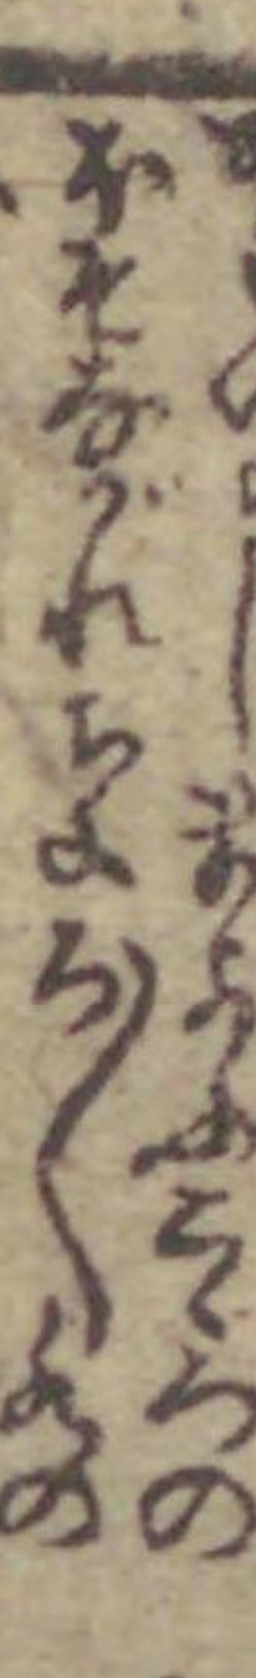ほそながれちよろ〳〵みずの
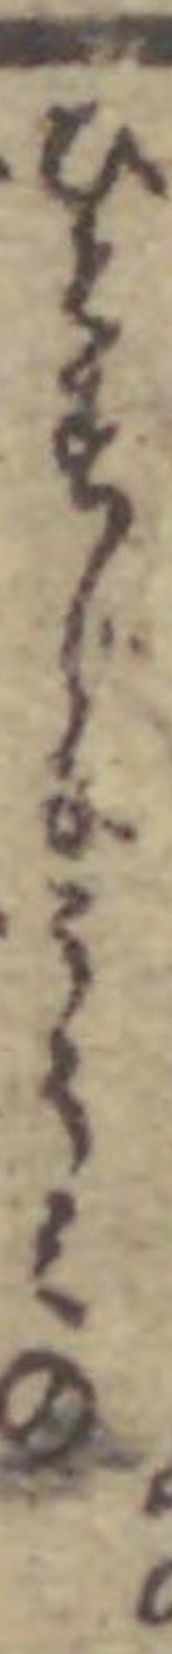ひとすじにうらミの
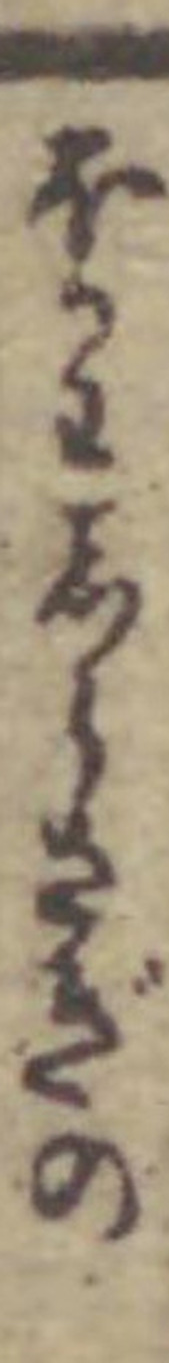ほかわしらさぎの
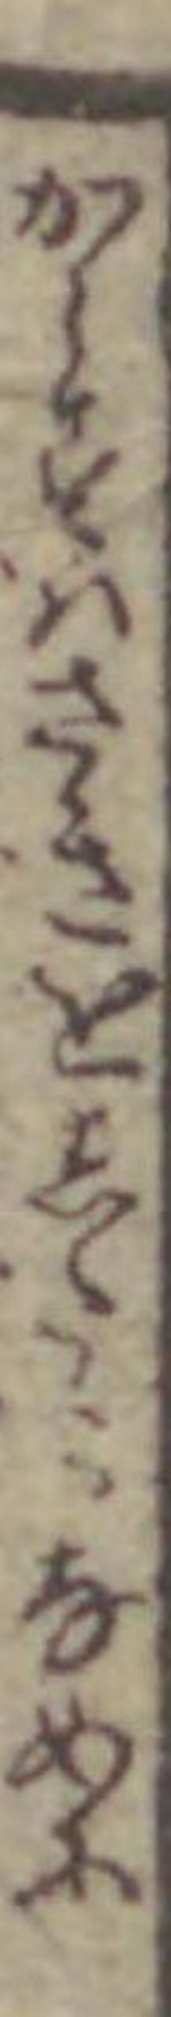からすハさきをしたゝかなめに
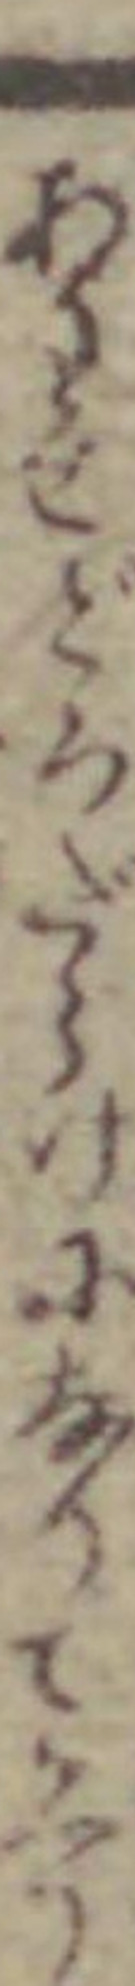あわせどろだらけになりてかへり
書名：烏行水諺草 3巻
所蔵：国立国会図書館 National Diet Library, JAPAN
